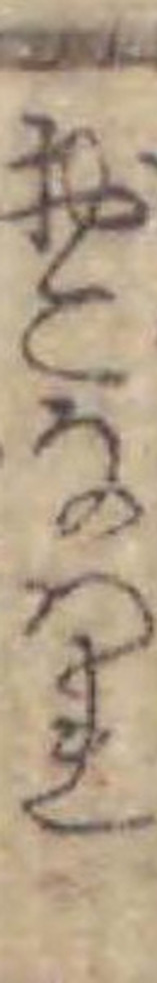おこなはれ
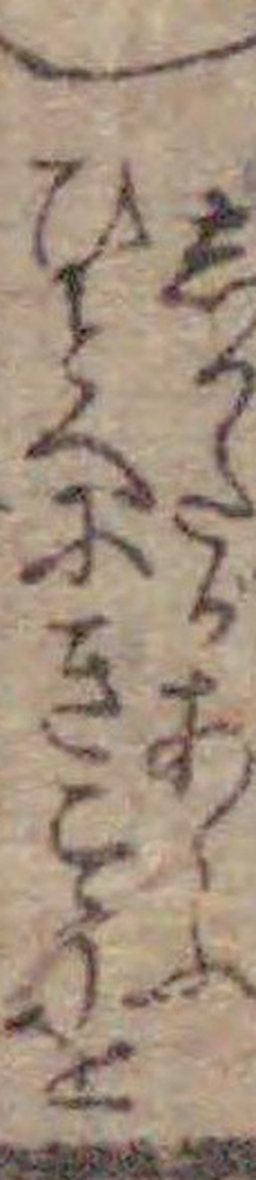ひとへにきこうを
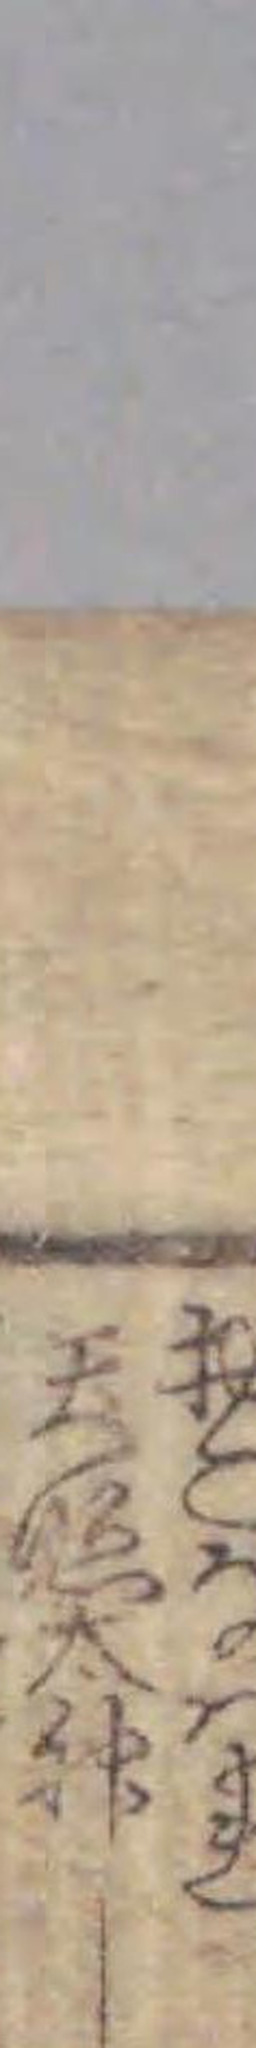天照太神
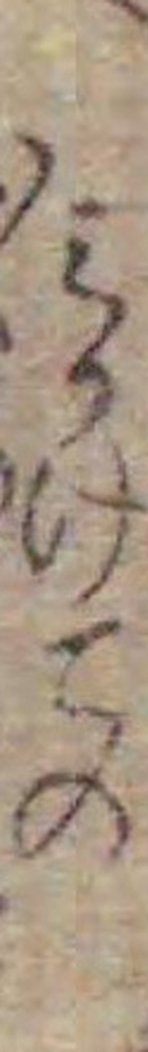みかけての
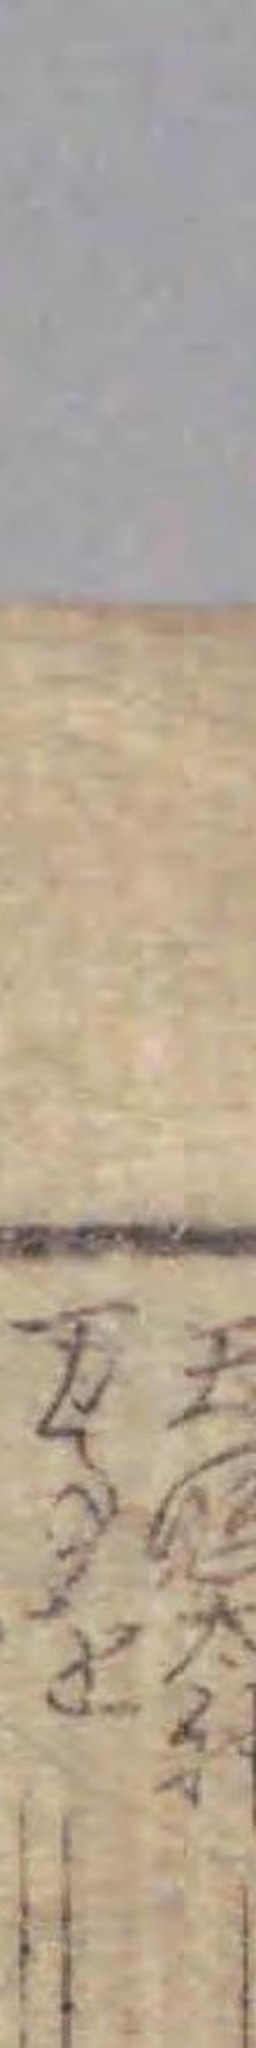万事を
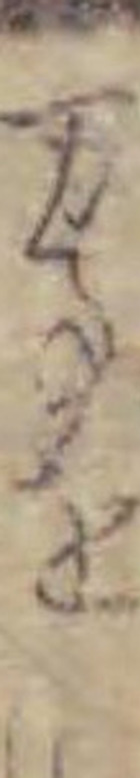万事を
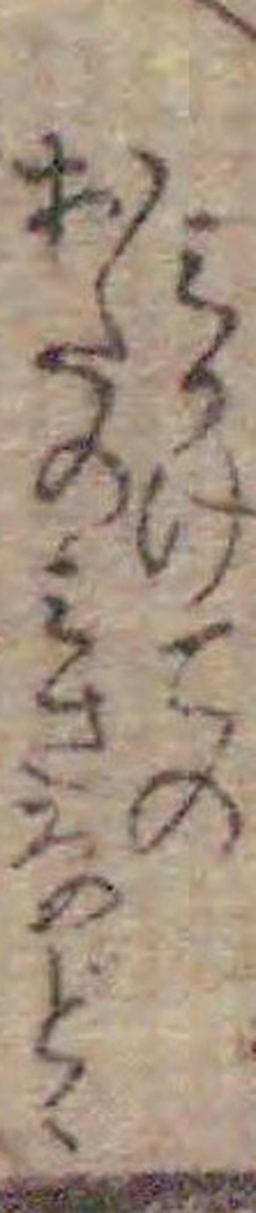おたのみさなどゝ
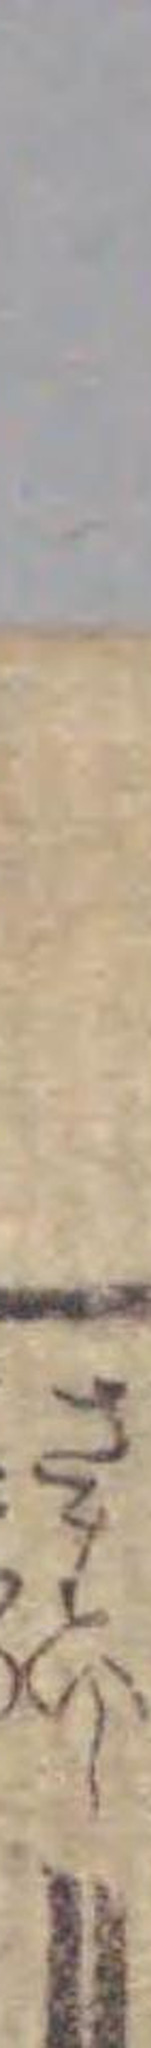さはいし
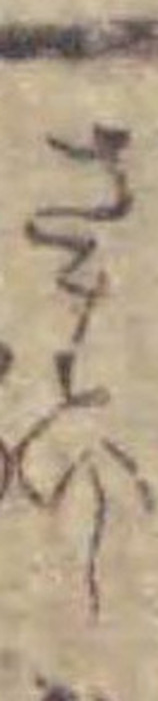さはいし
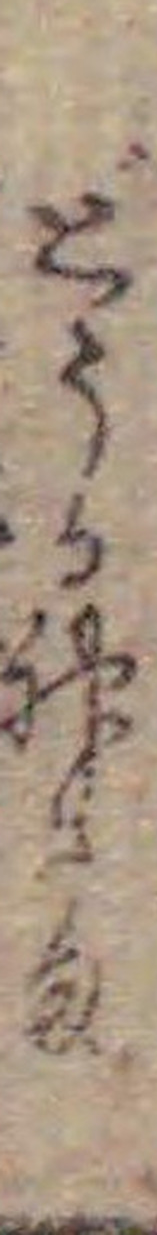どうか神さま
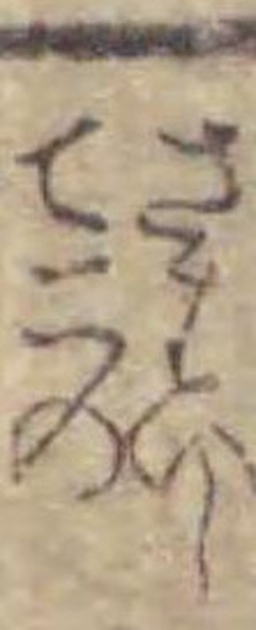てこの
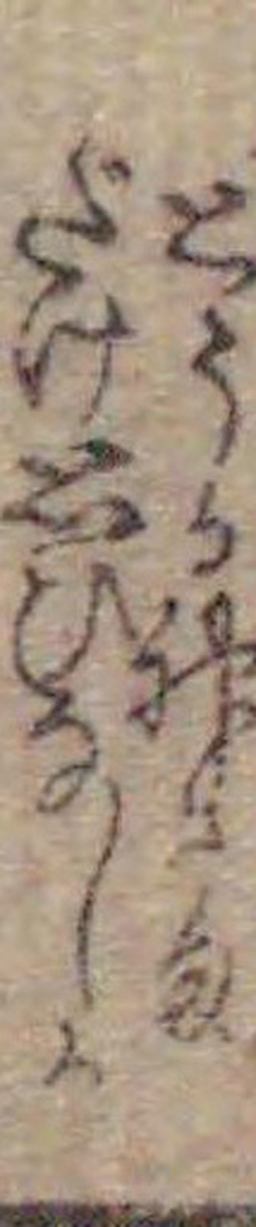だけ思ひなしか
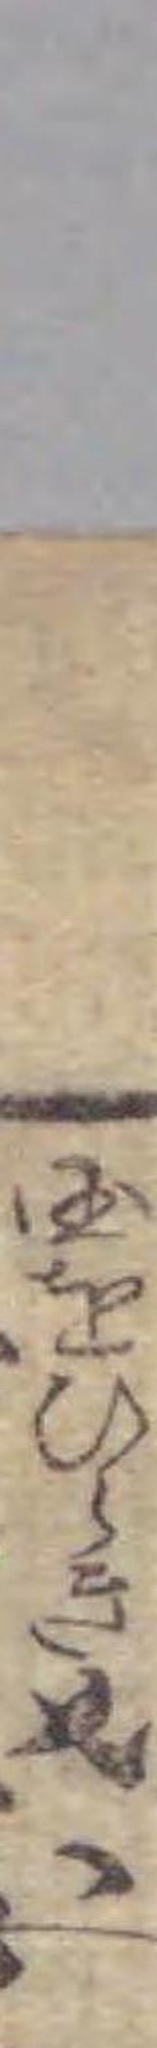国をひらき
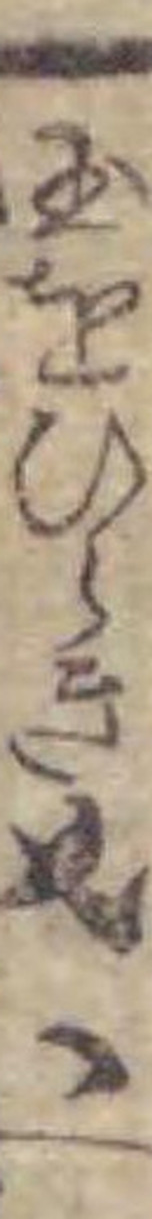国をひらき
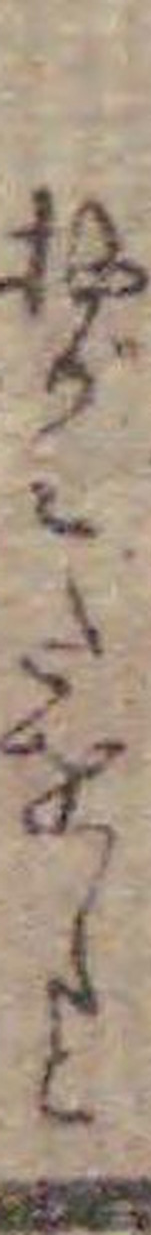おがみたをして
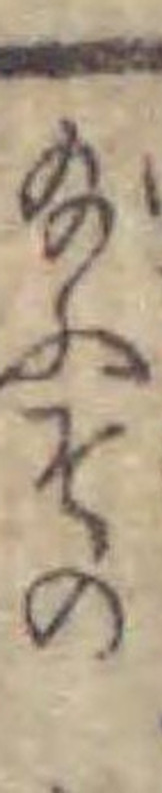給ふその
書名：奇妙頂礼胎錫杖 : 3巻
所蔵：国立国会図書館 National Diet Library, JAPAN
